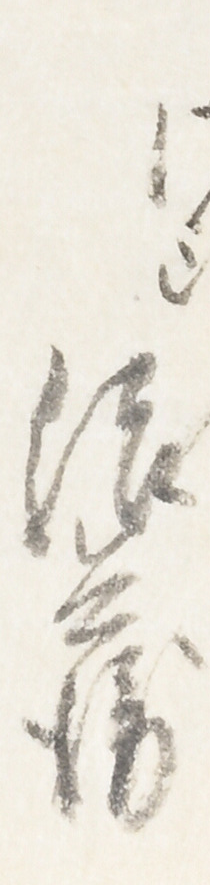治兵衛
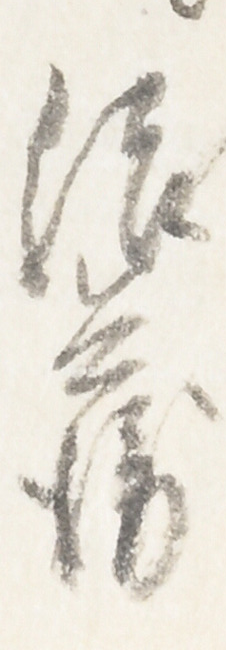治兵衛
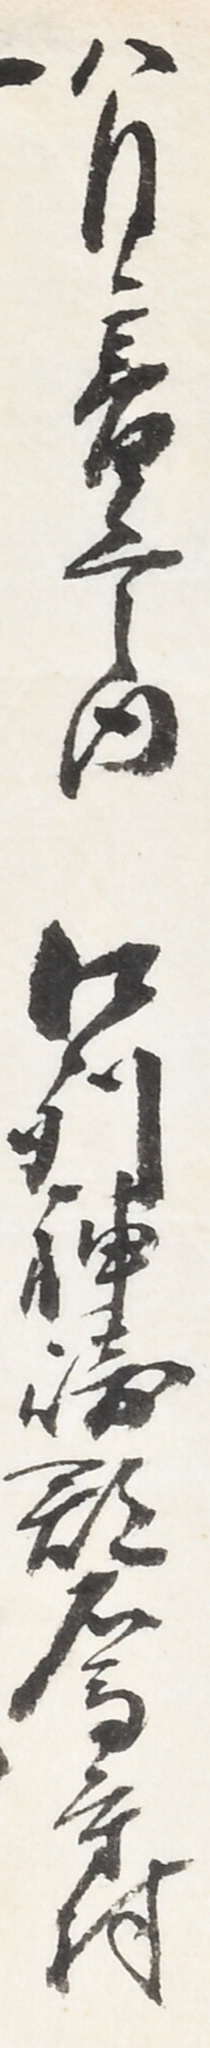八月書上之内江州神崎郡石馬寺村
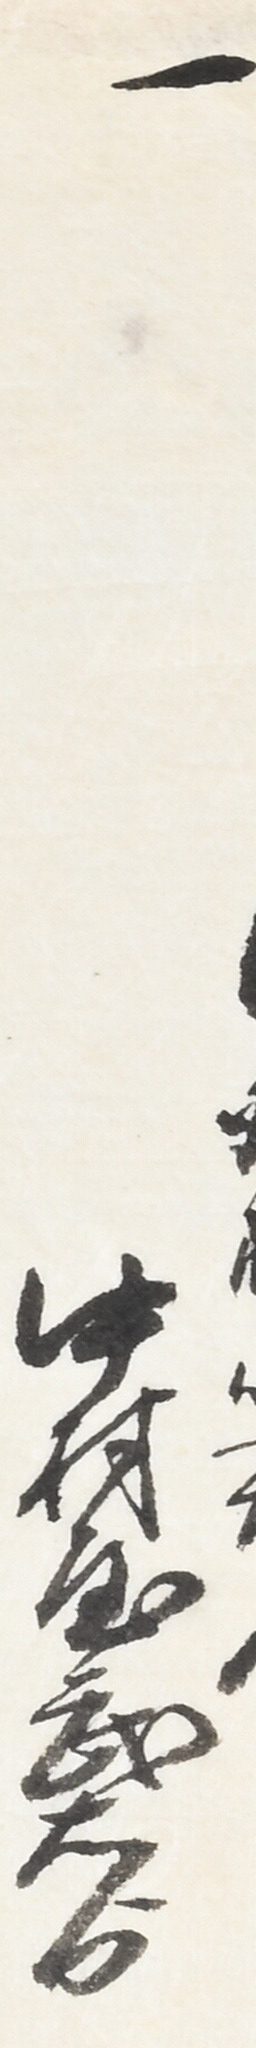一中村屋武右衛門
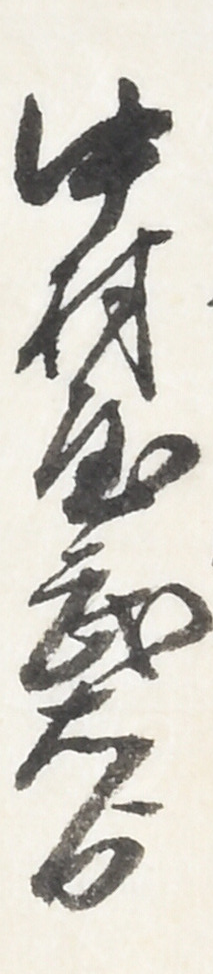一中村屋武右衛門
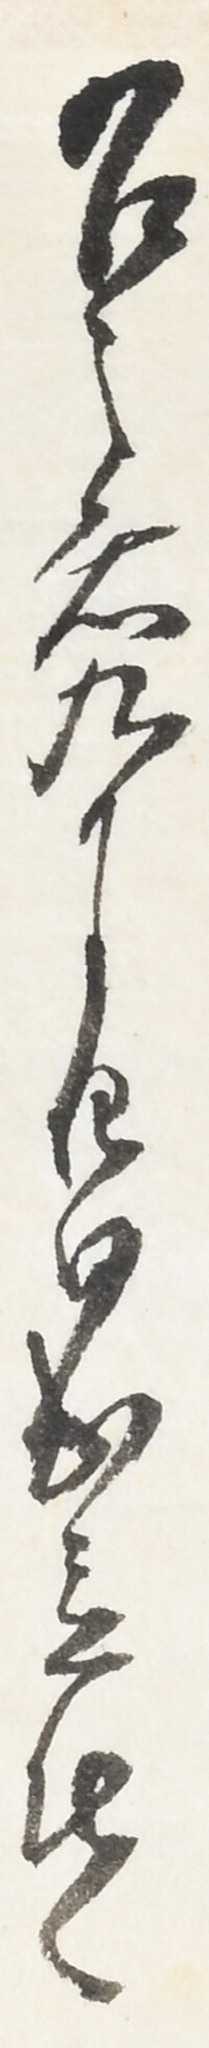右之者九月四日出立仕候
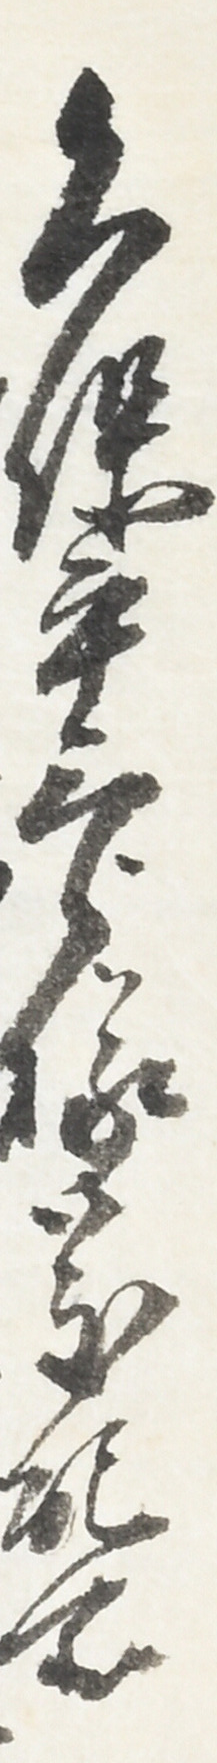久保平三郎様御支配所
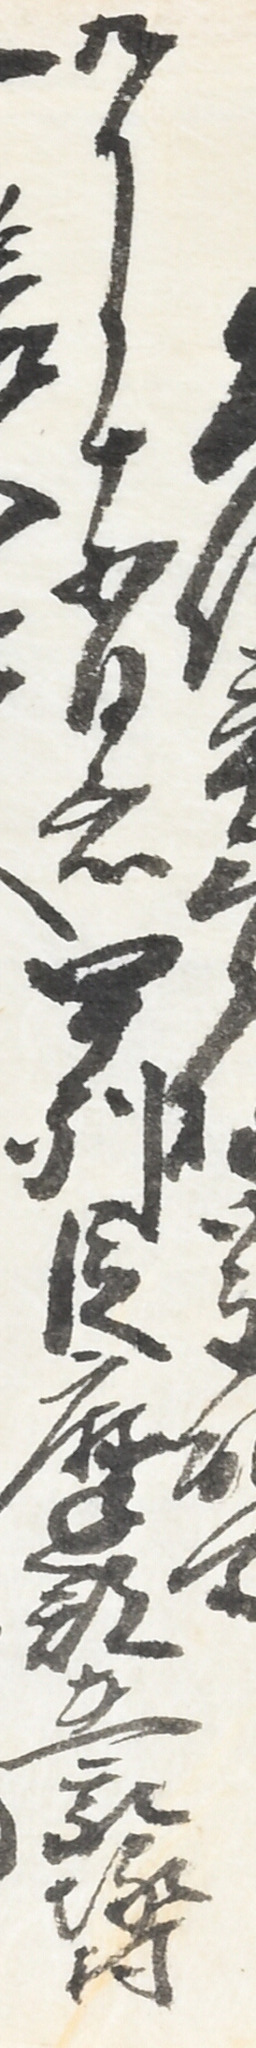九月十五日着甲州巨摩郡在家塚村
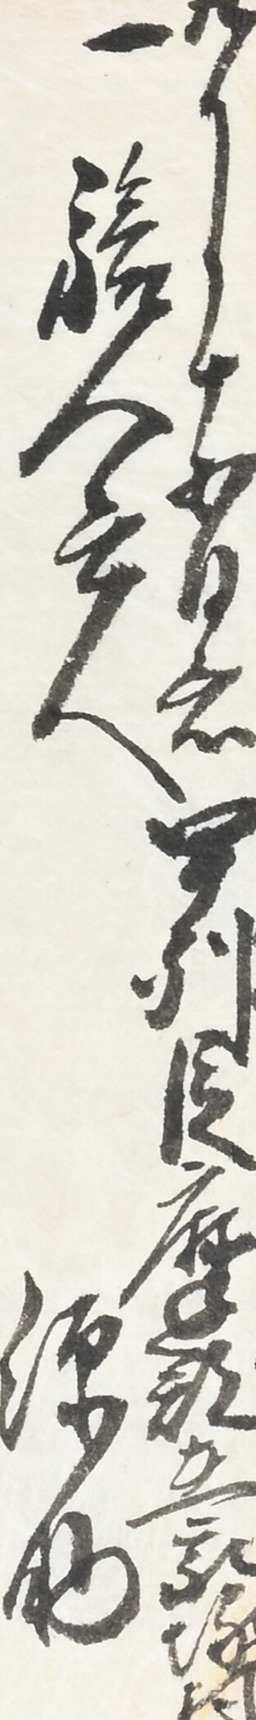一旅人壱人源助
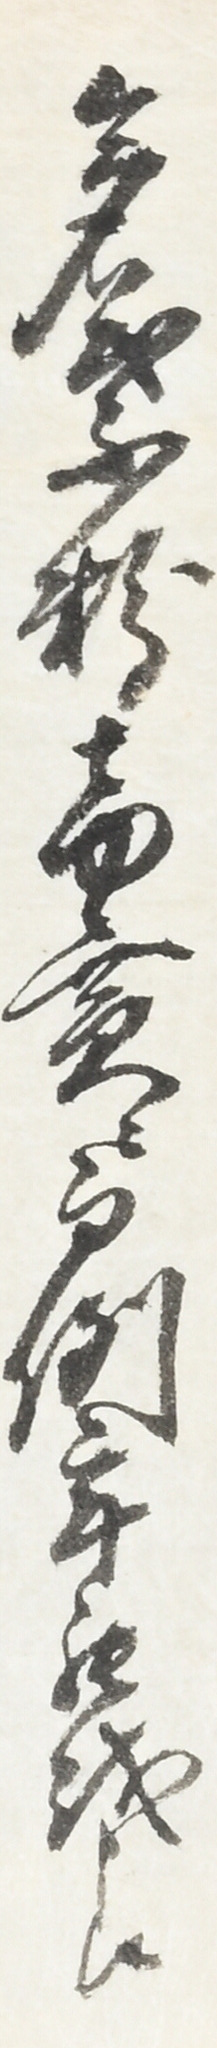多葉粉商売ニ而例年罷越申候
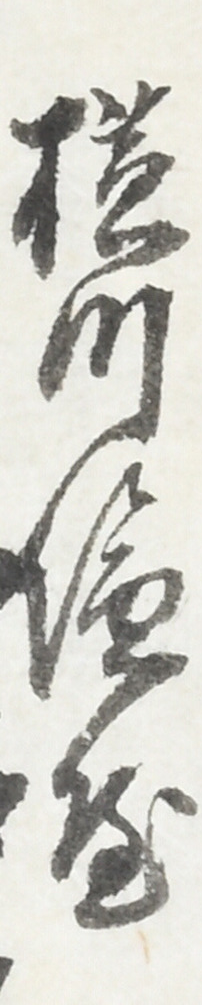横町塩屋
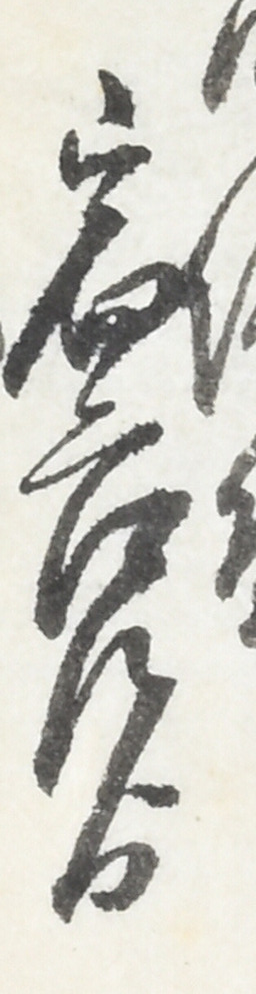宿吉左衛門
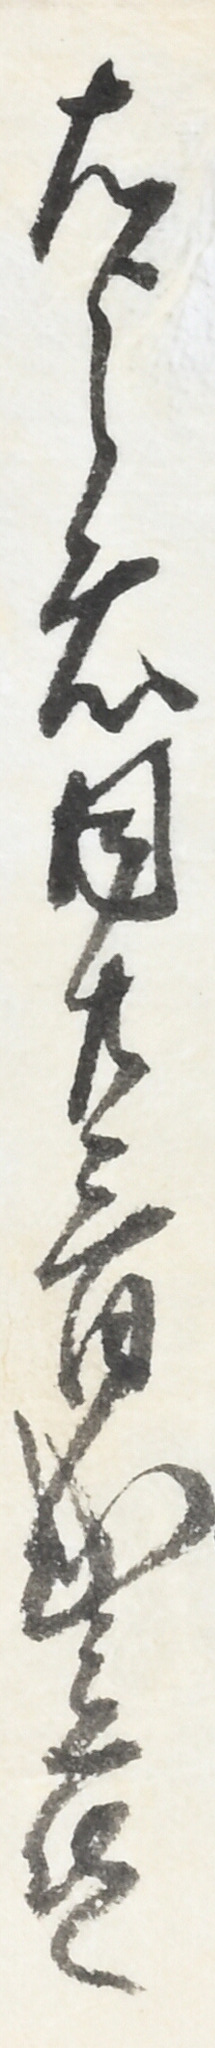右之者同廿三日出立仕候

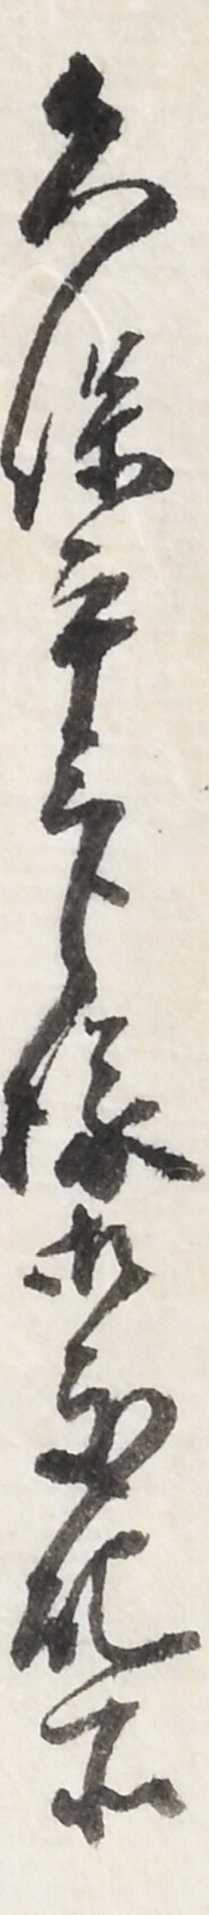久保平三郎様御支配所
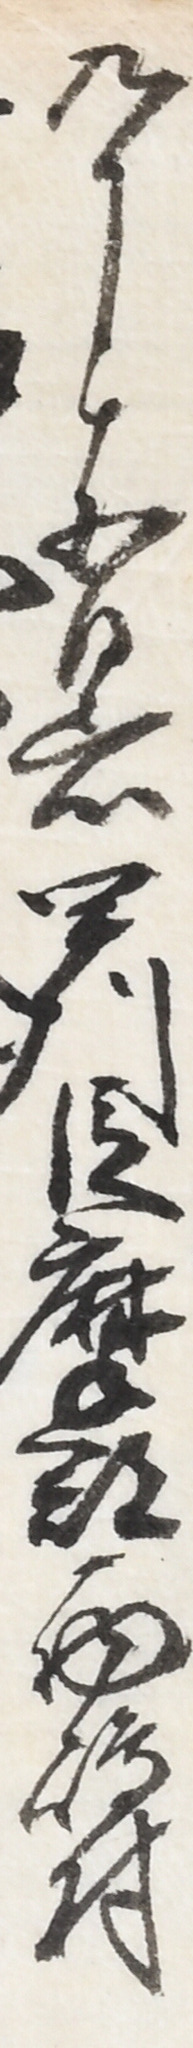九月十五日着甲州巨摩郡西嶋村
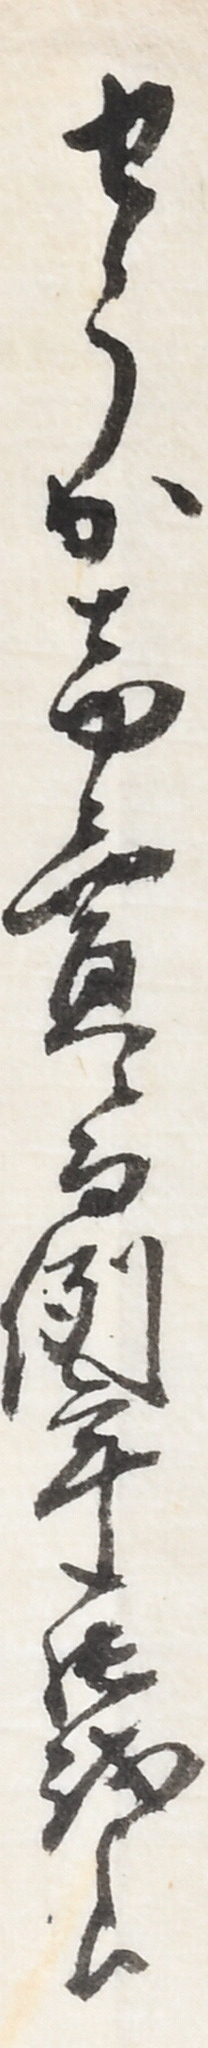せうか商売ニ而例年罷越申候
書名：旅人泊控帳
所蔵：伊那市立高遠町図書館・合同会社AMANE
